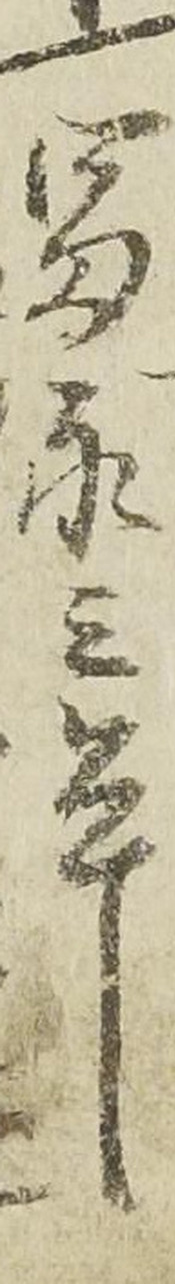富永三平
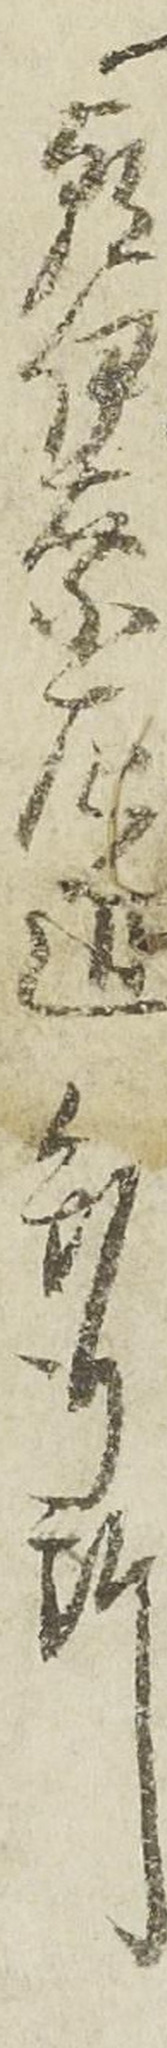朝伊奈左近知行所

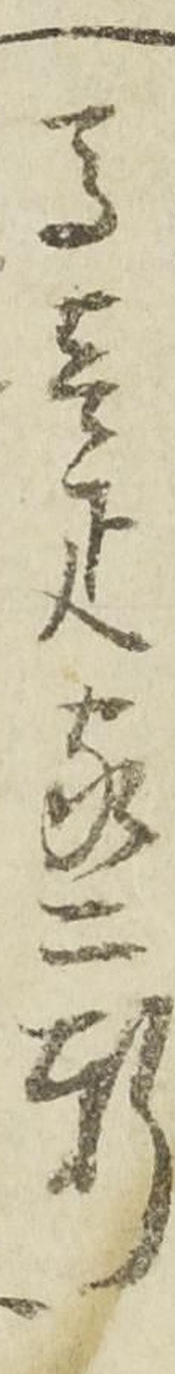馬壱疋家二軒
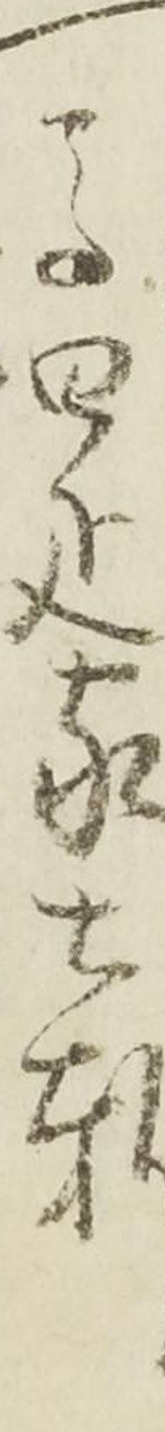馬壱疋家二軒
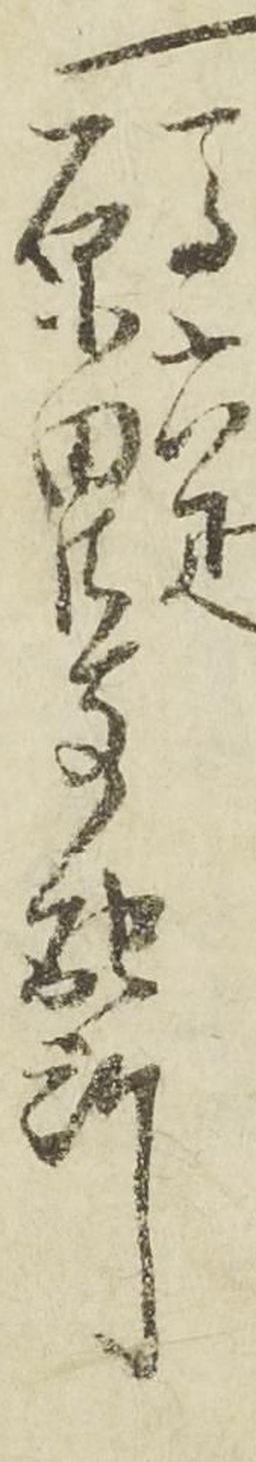原田原田御支配所
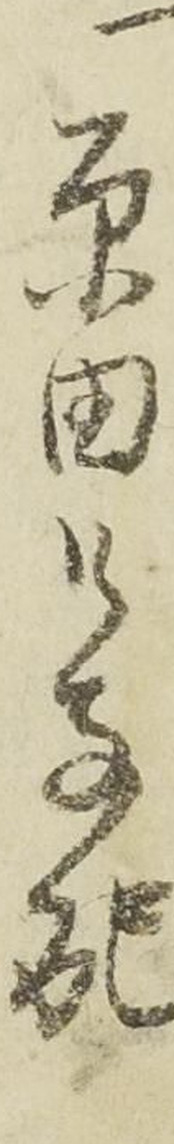原田御支配
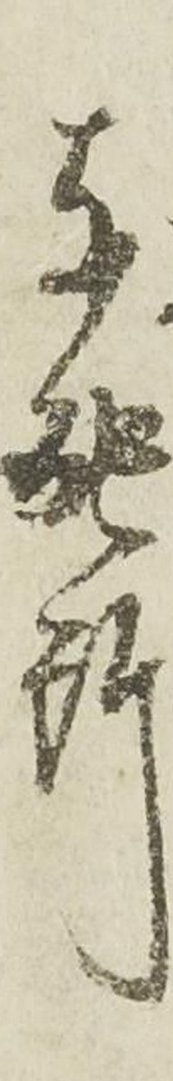支配所
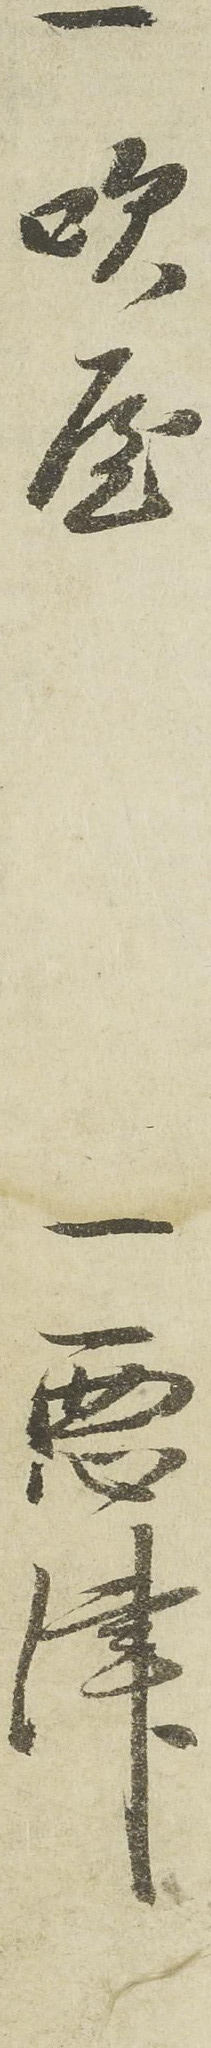一吹屋一悪津

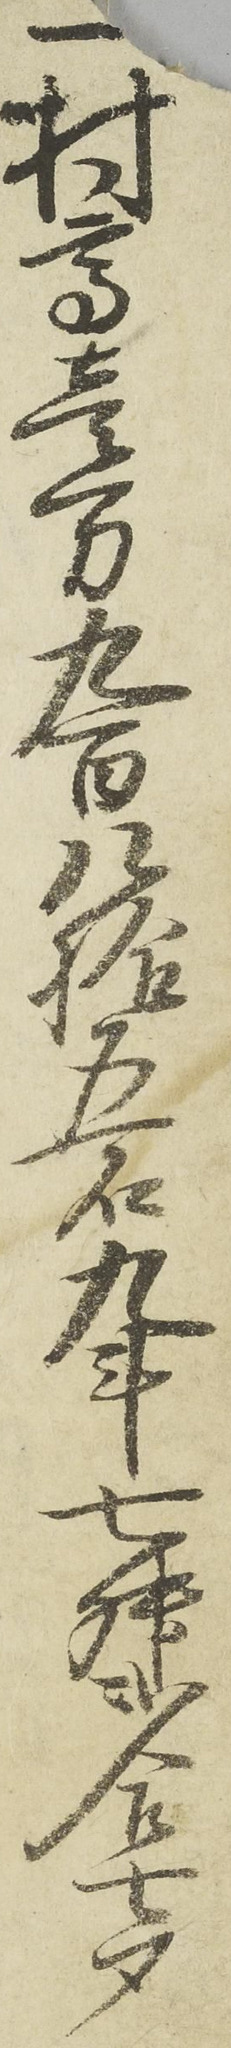一村高壱万九百八拾五石九斗七升弐合七夕
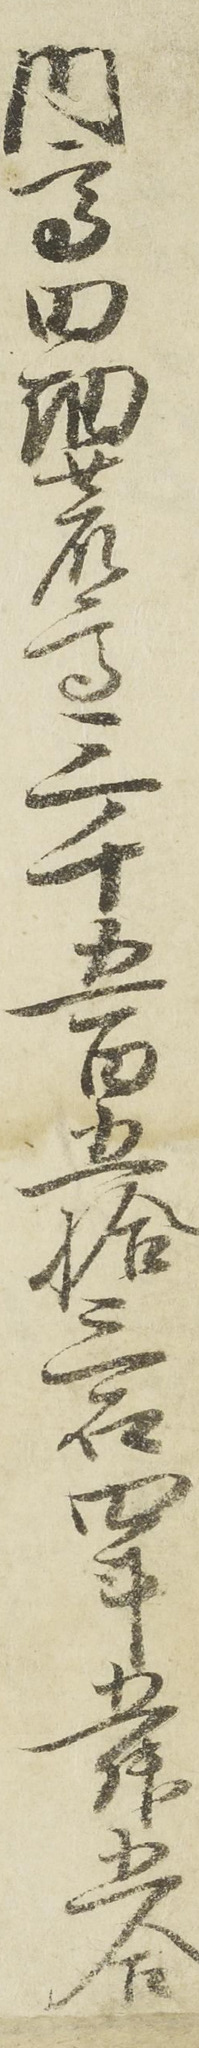内高田畑荒高三千五百五拾三石四斗五升五合
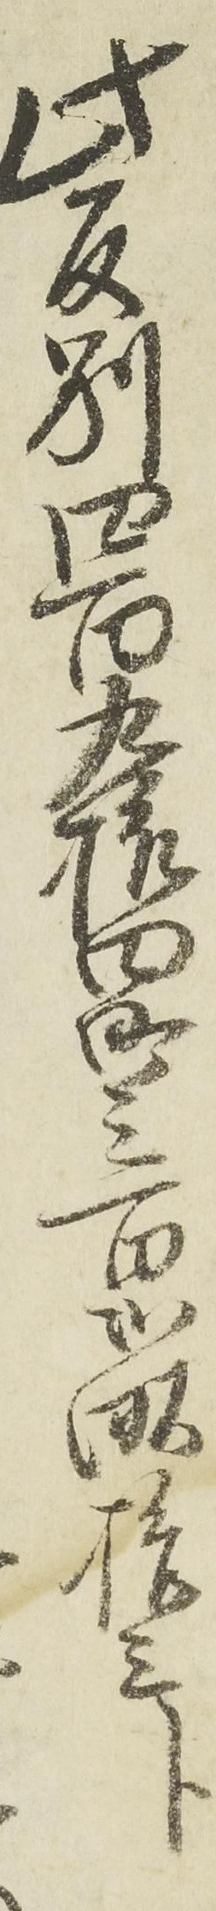此反別四百九拾四町三百弐畝拾三歩
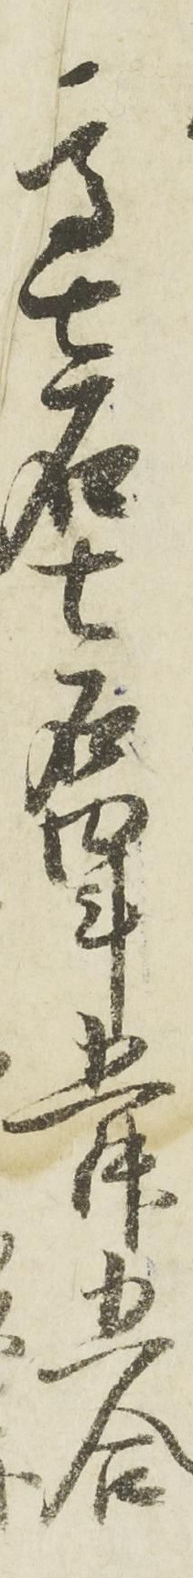高七石七石四斗五升五合
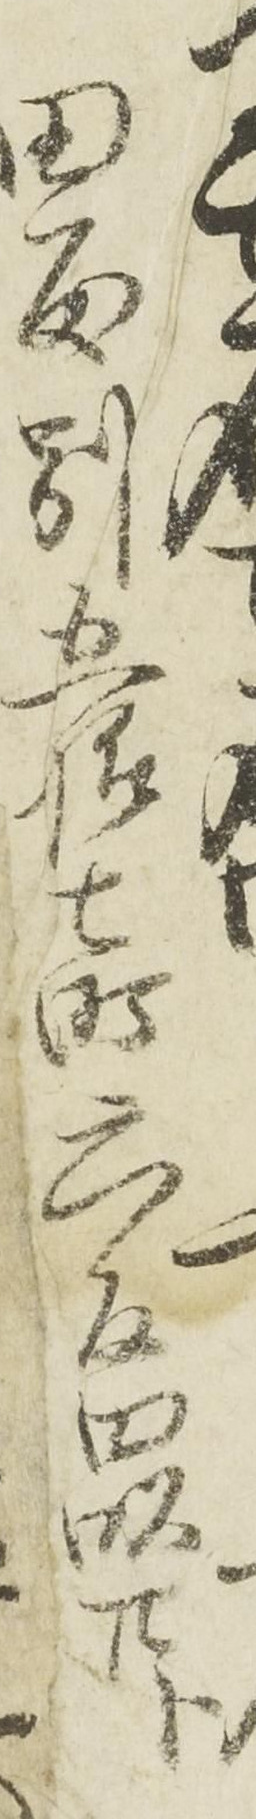内田反別五拾七町六反四畝廿歩
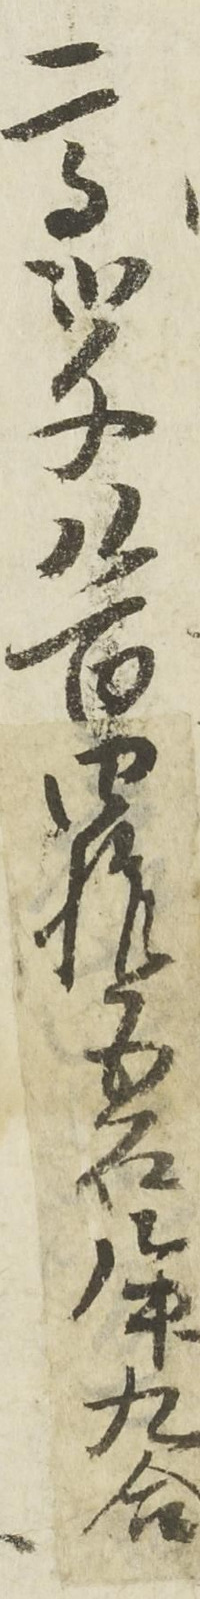高弐千八百四拾五石八斗九合
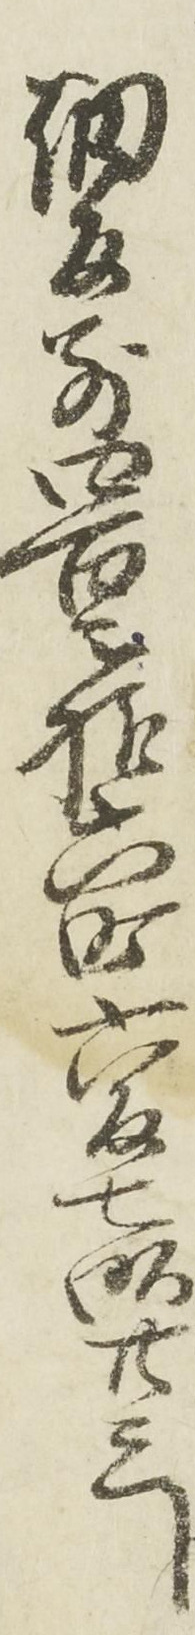畑反別四百三拾六町六反七畝廿三歩
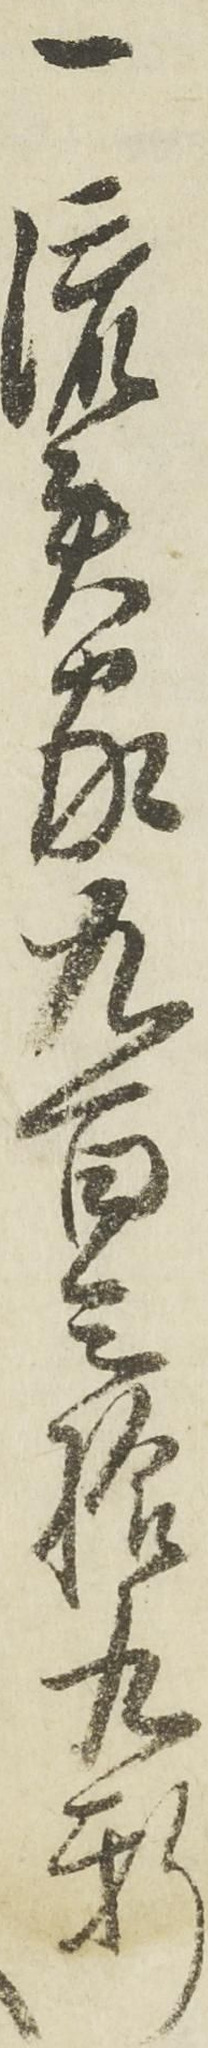一流失家九百三拾九軒
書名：浅間大変略記
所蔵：東京大学地震研究所図書室 Earthquake Research Institute Library, The University of Tokyo, JAPAN
